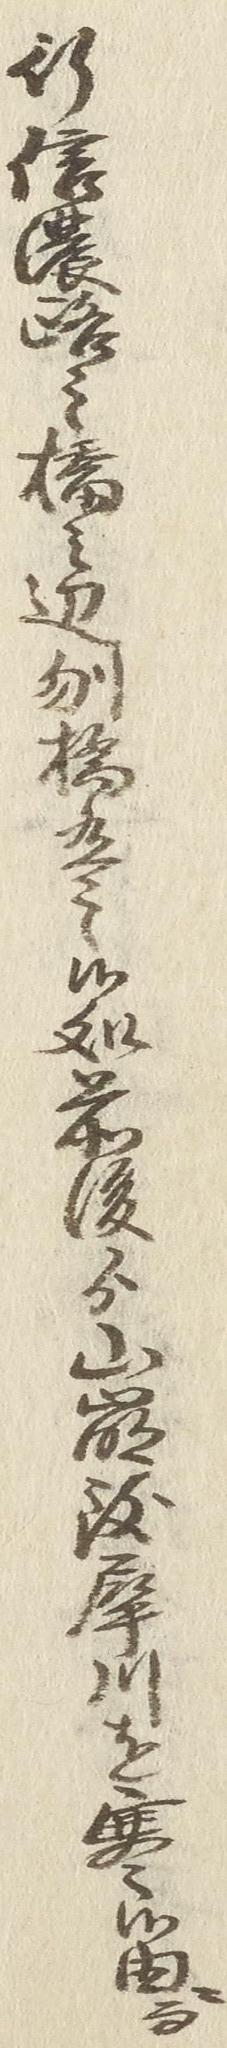行信濃路橋之辺刎橋有之候処前後ゟ山崩致犀川を塞候由二而
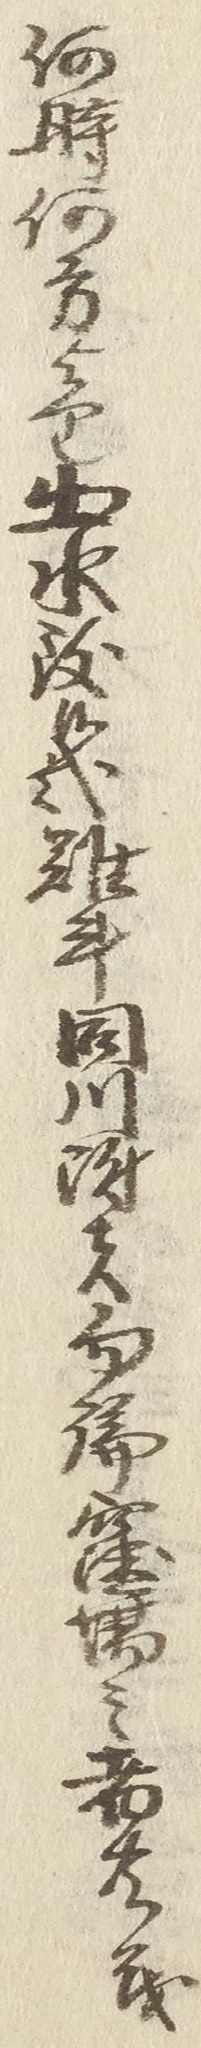何時何方より出水致候哉難斗同所川附は勿論窪場之者共も
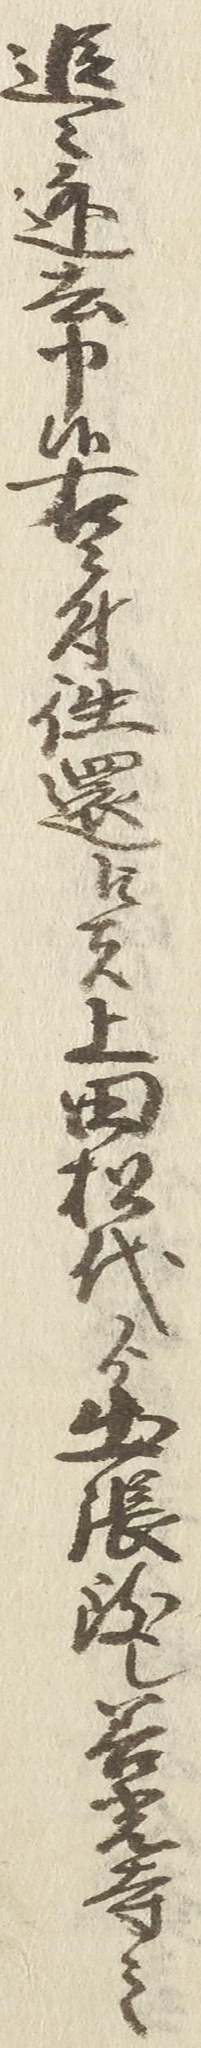追々逃去申候右二付往還江は上田松代ゟ役人出張致善光寺之
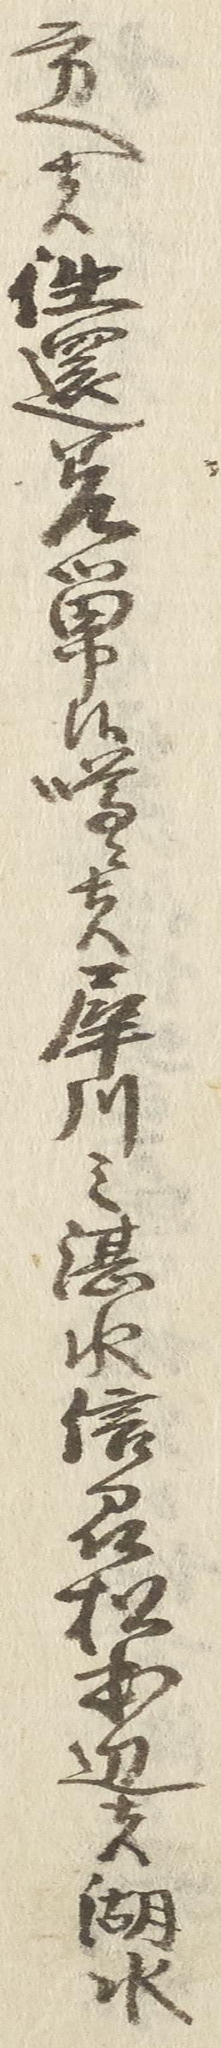方へは往還差留申候噂二は犀川之湛水信州松本辺は湖水
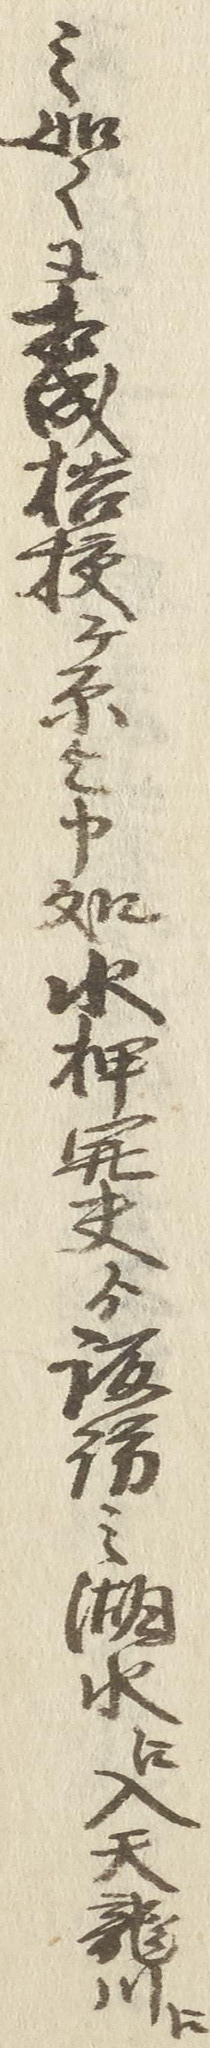之如くに相成桔梗ヶ原と申処水押開夫ゟ諏訪之湖水江入天流川江
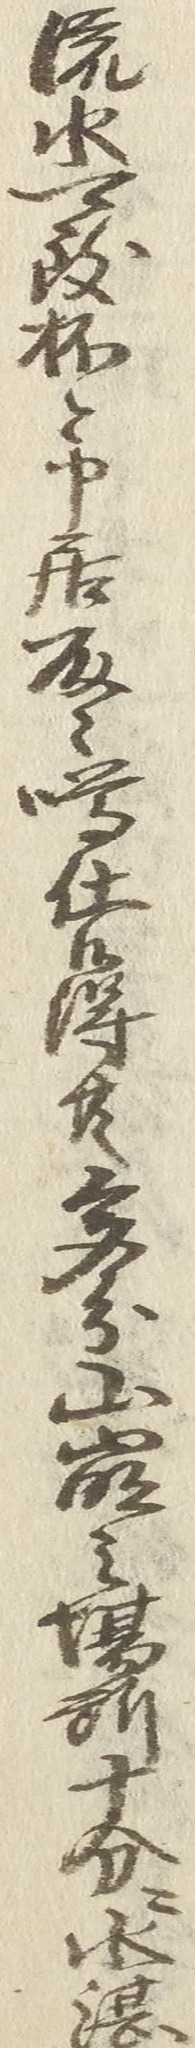流水可致抔と申居取々噂仕候得共多分山崩之場所十分二水湛

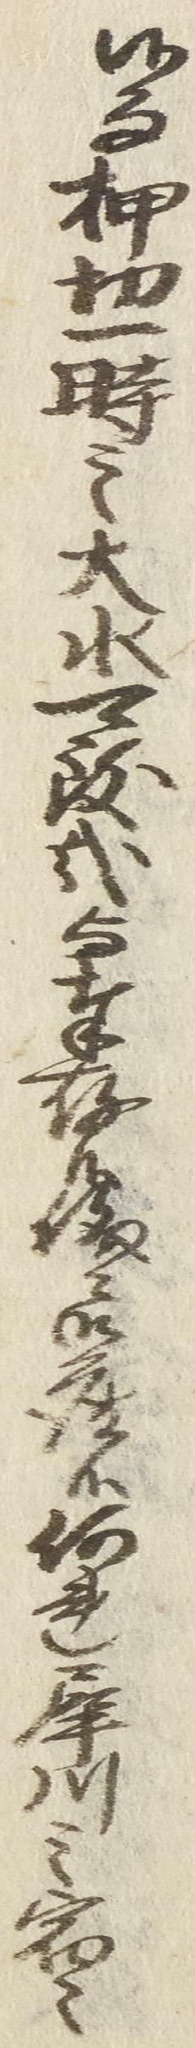候而押切一時之大水可致哉と奉存候儀二御座候何れ犀川之宿々
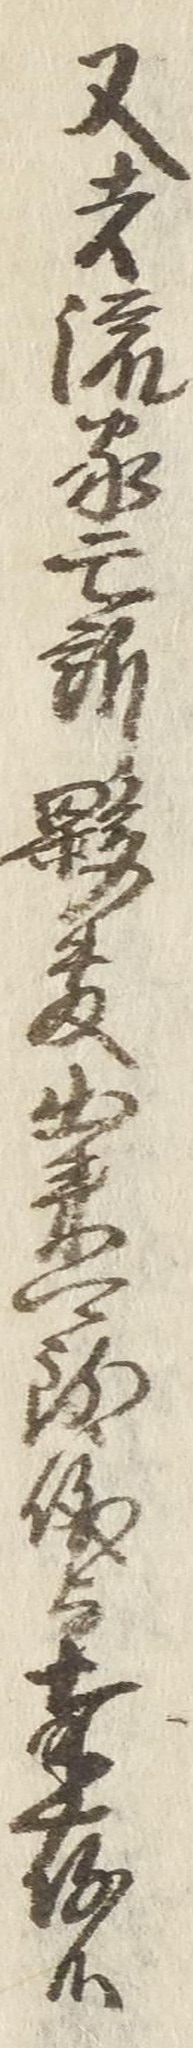又は流家亡所夥敷出来可致義と奉存候
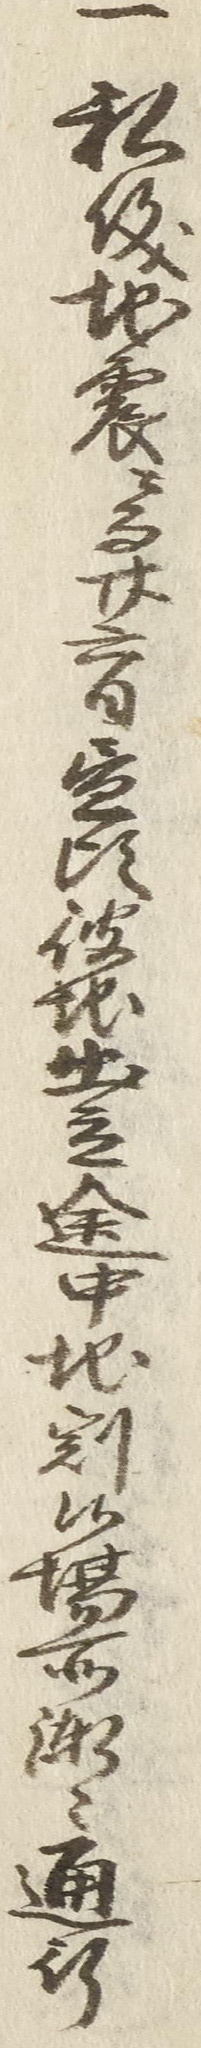一私儀地震二而廿六日昼頃彼地出立途中地割候場所漸々通行
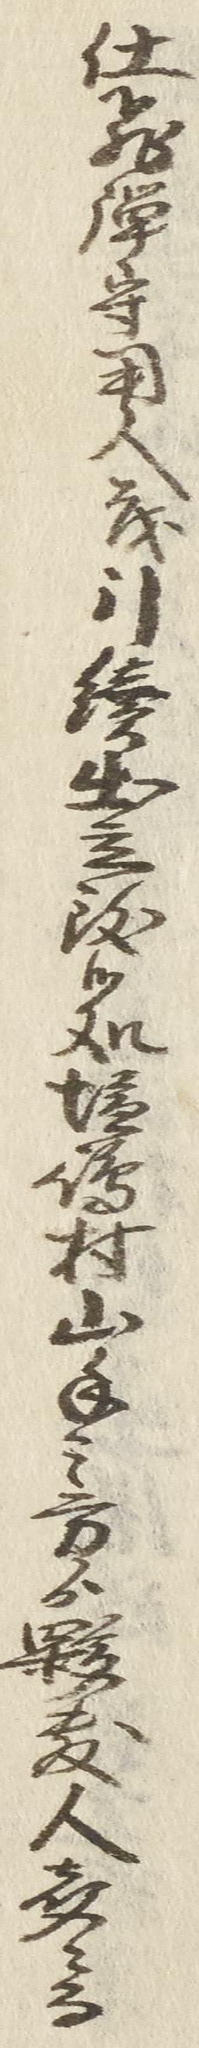仕飛騨守用人も引続出立致候処塩崎村山手之方ゟ夥敷人声二付而
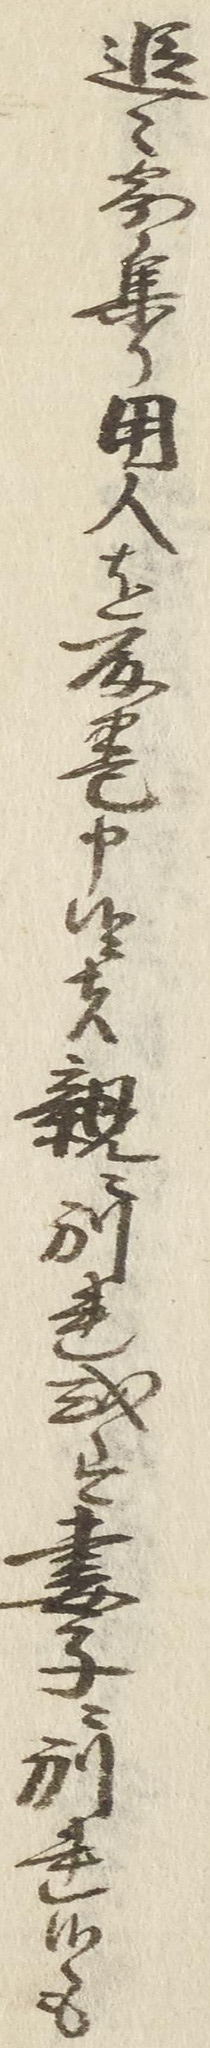追々寄集り用人を取巻申候は親に別れ或は妻子二別れ候も
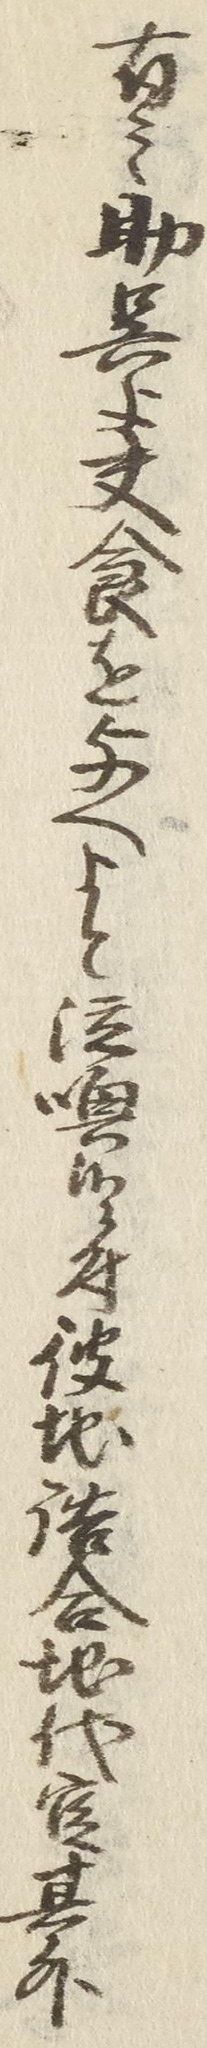有之助呉よ夫食を与へよと泣喚候二付彼地詰合地代官其外
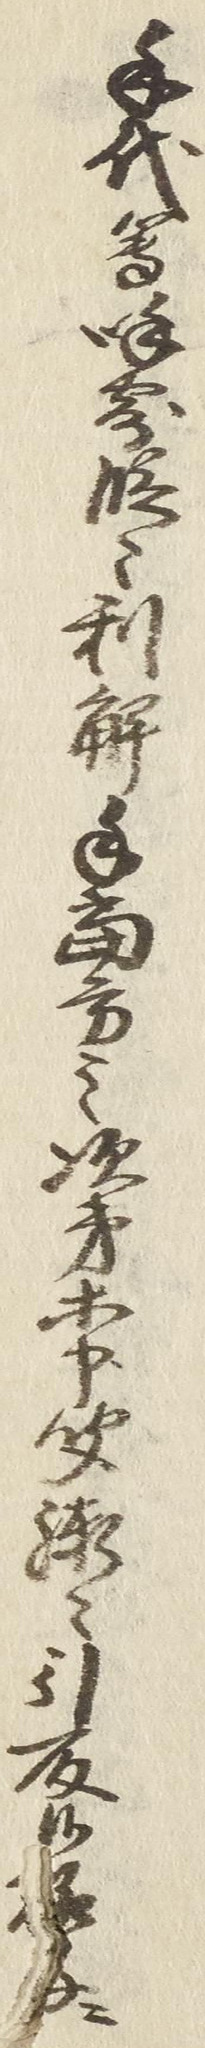手代等呼寄段々利解手当方之次第等申聞漸々引取候様子二
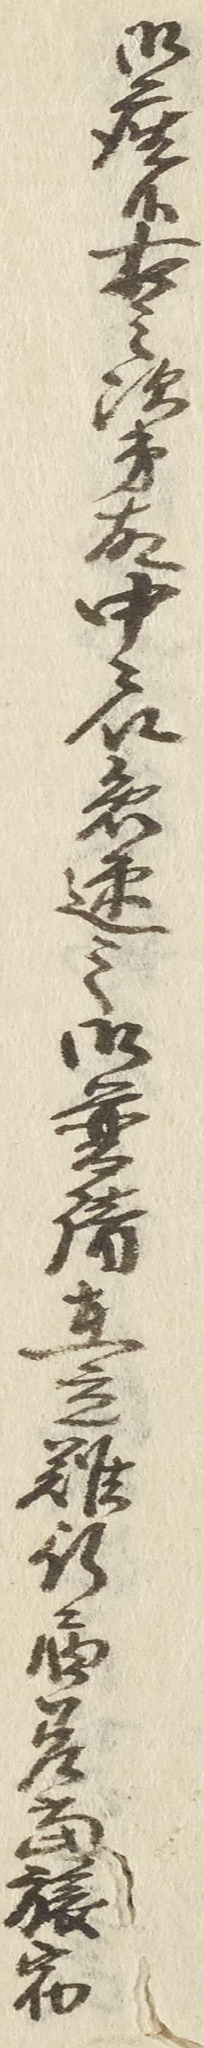御座候右之次第故中々以急速之御普請直立難行届差当旅宿
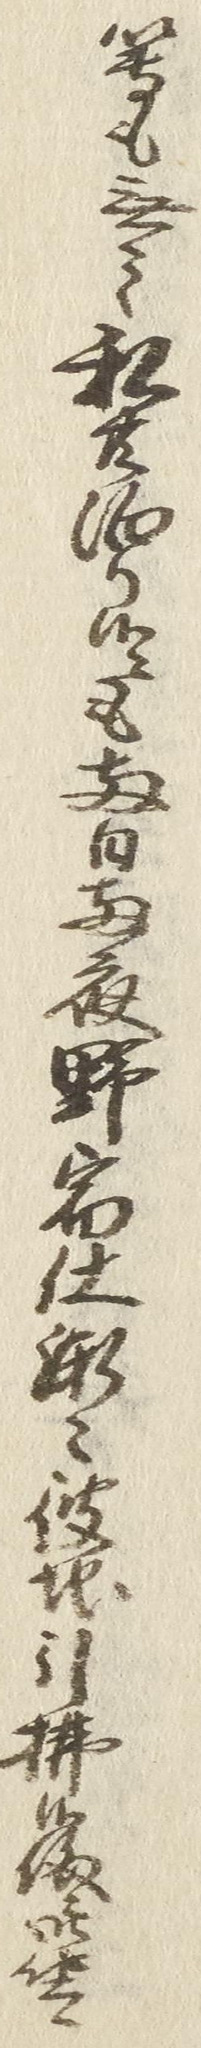等も無之私共泊り候二も両日両夜野宿仕漸々彼地引払候儀二御座候
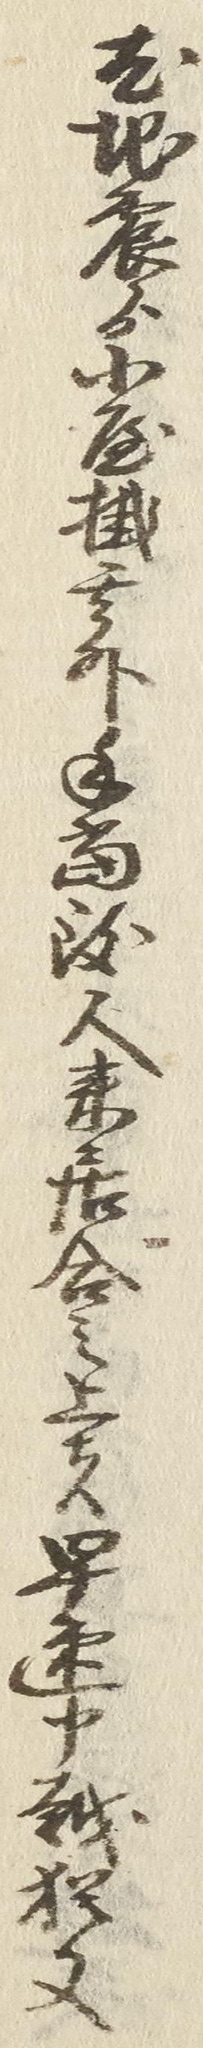尤地震ゟ小屋掛其外手当致人来居合之上は早速申越猶又
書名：従往古地震御届書記誌之一
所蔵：東京大学地震研究所図書室 Earthquake Research Institute Library, The University of Tokyo, JAPAN
